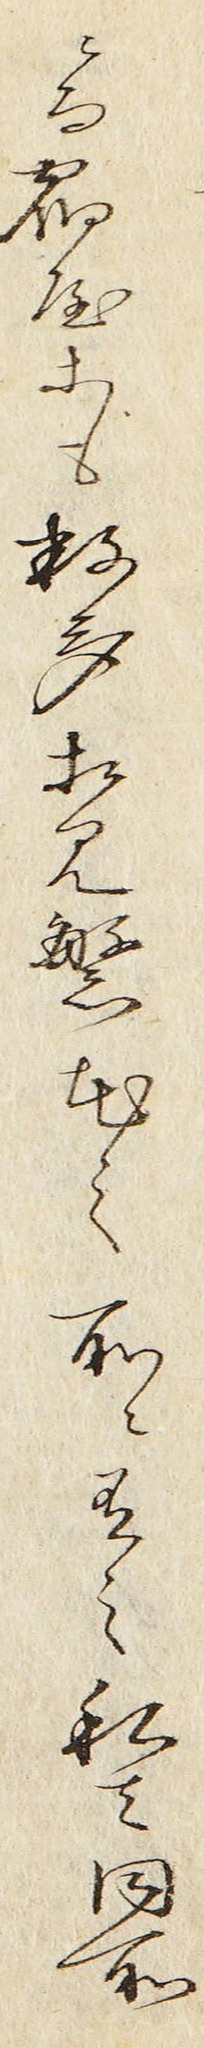に而宿屋等も数多相見繫花之所に有之私は同所
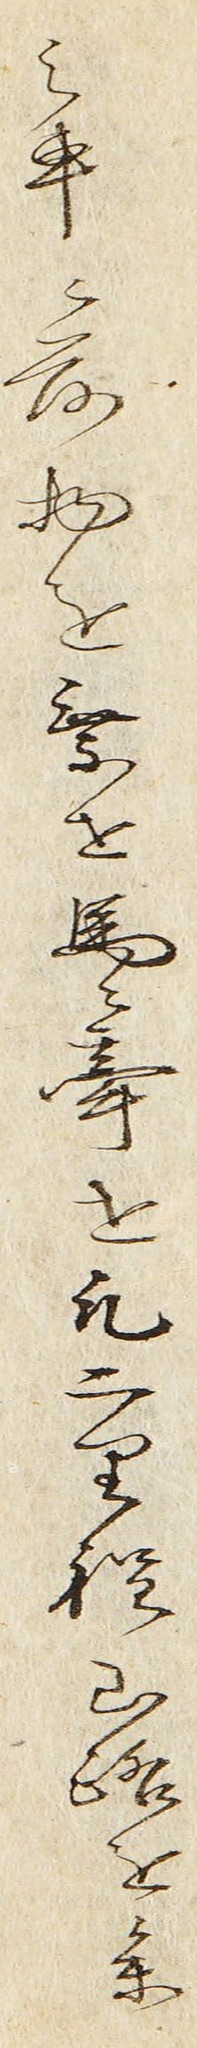之車に荷物を乗せ馬に牽せ凡二里程山路を参
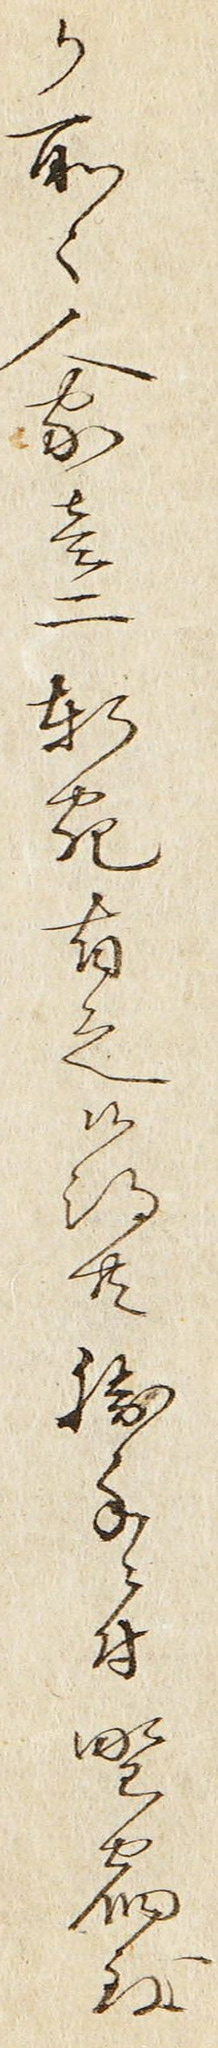り所々人家壱二軒宛有之候得共勝手に付野宿致
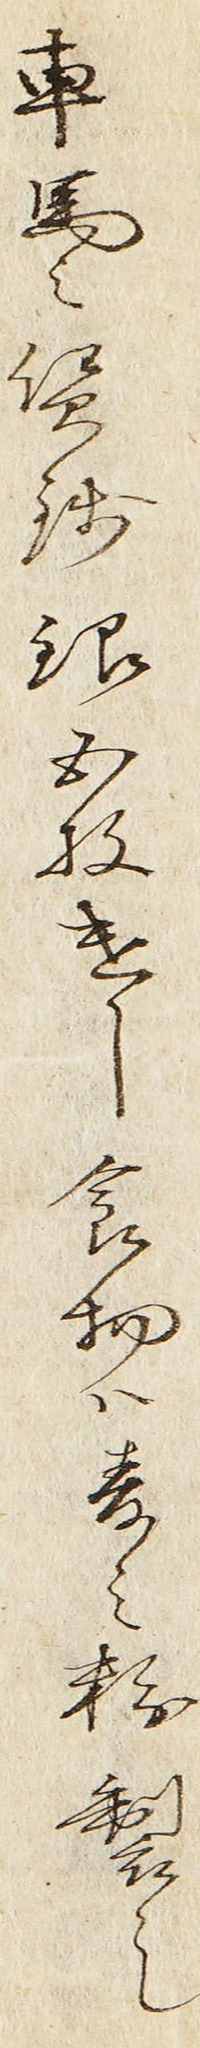車馬之賃銭銀五枚遣し食物は麦之粉製し
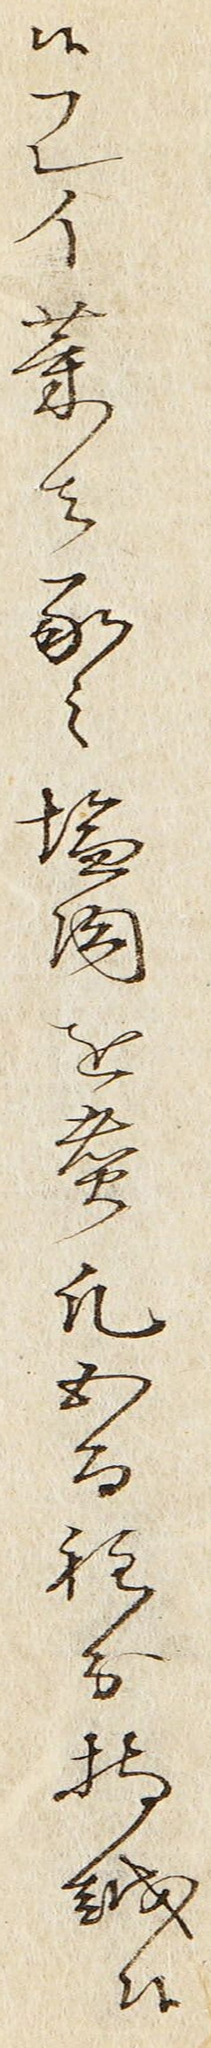候フレイ菜は豕之塩肉を煮凡五日程分持越候
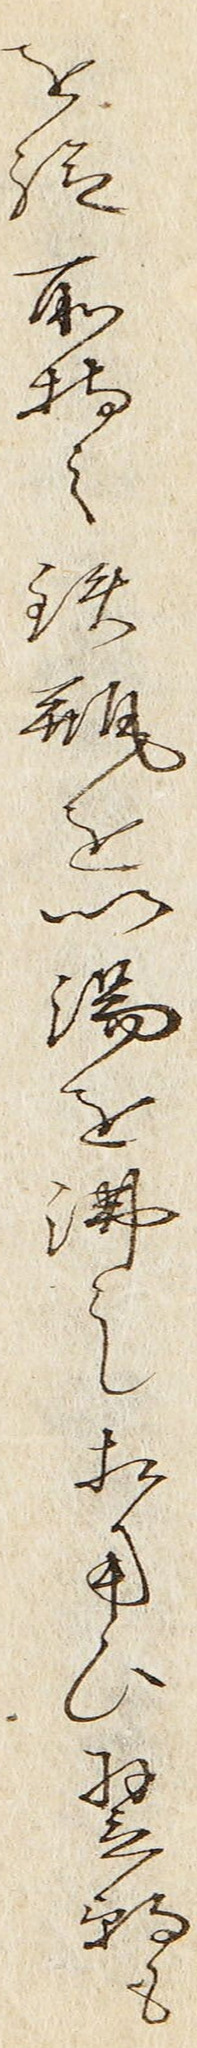を給所持之鉄瓶を以湯を沸相用ひ翌朝も
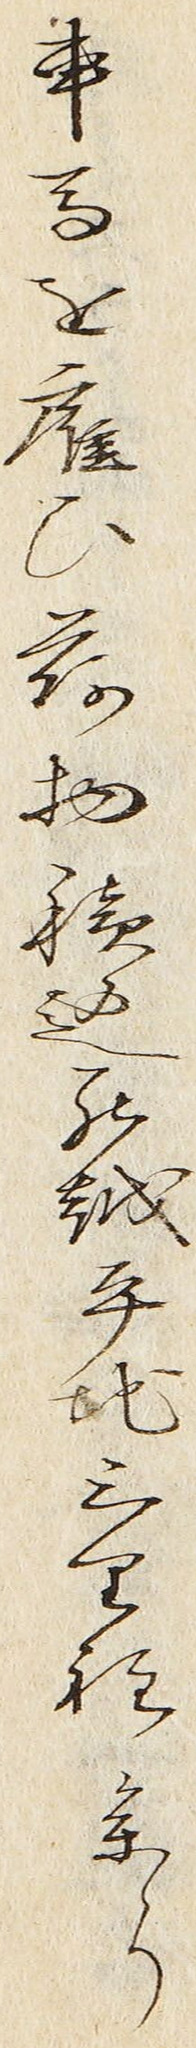車馬を雇ひ荷物を積込罷越平地三里程参り
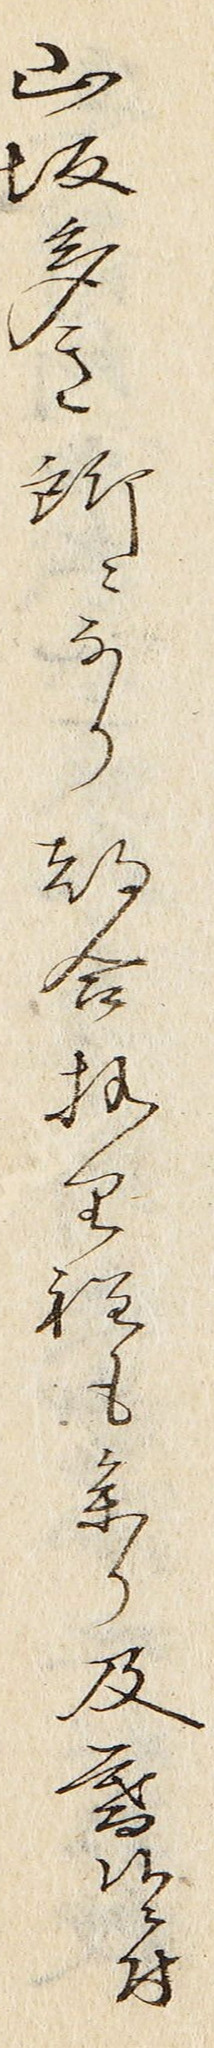山坂多き所になり都合拾里程も参り及暮候に付
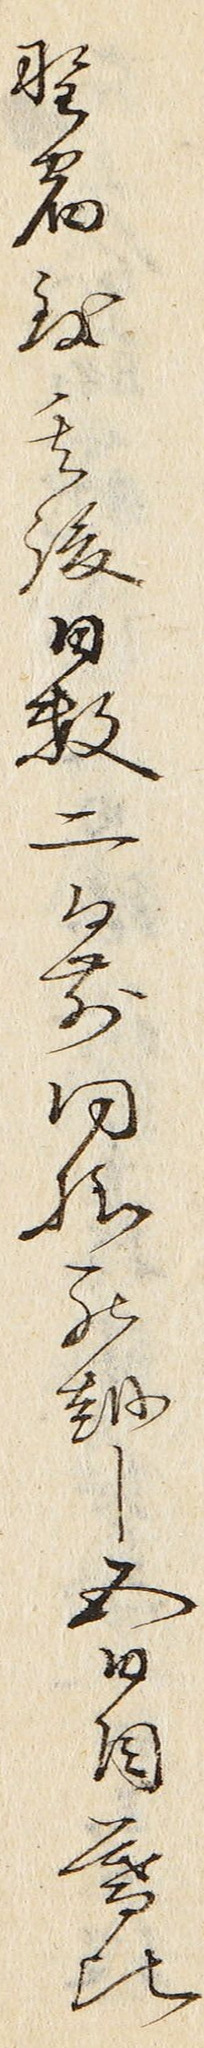野宿致其後日数二日前同様罷越し五日暮比
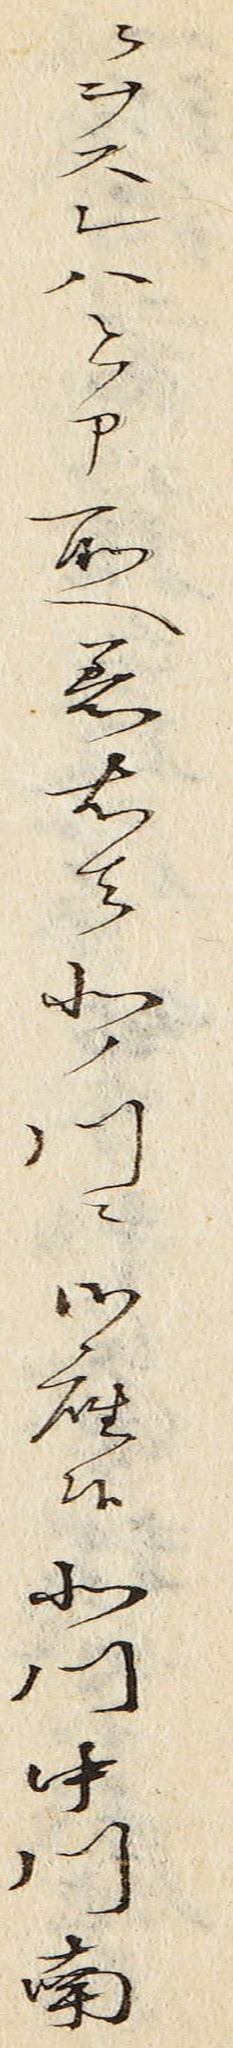にヲスレハと申所へ着右は北ノ川に御座候北川中川南
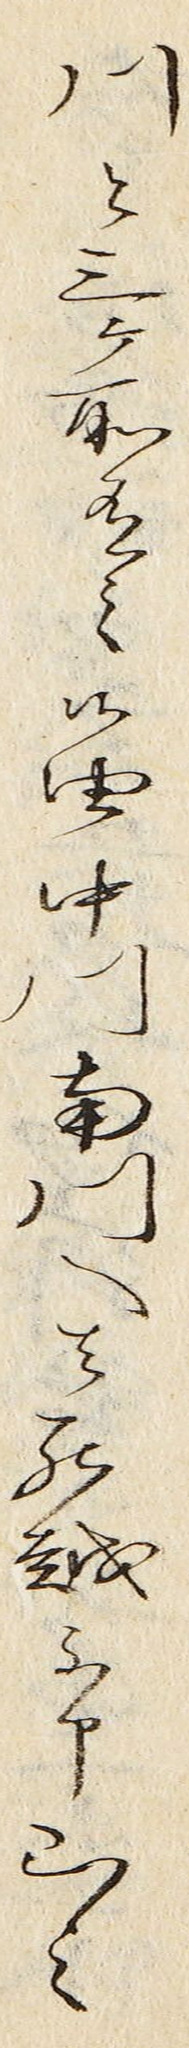川と三ヶ所有之候由中川南川へは罷越不申山之
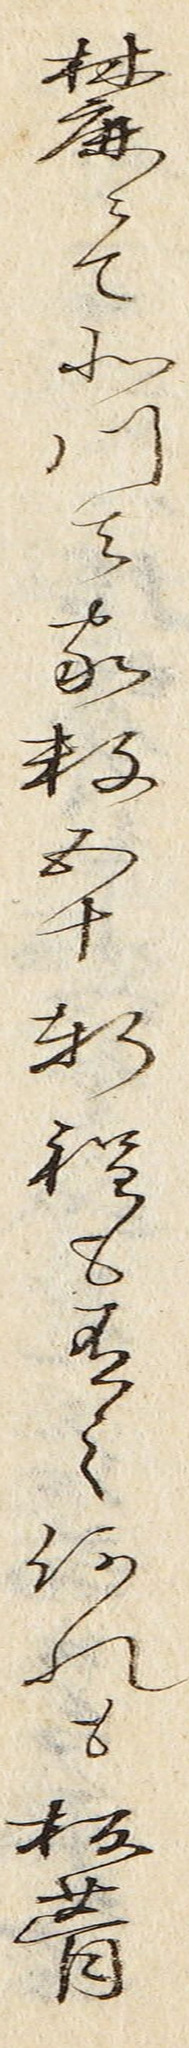麓にて北川は家数五十軒程も有之いず何れも板葺
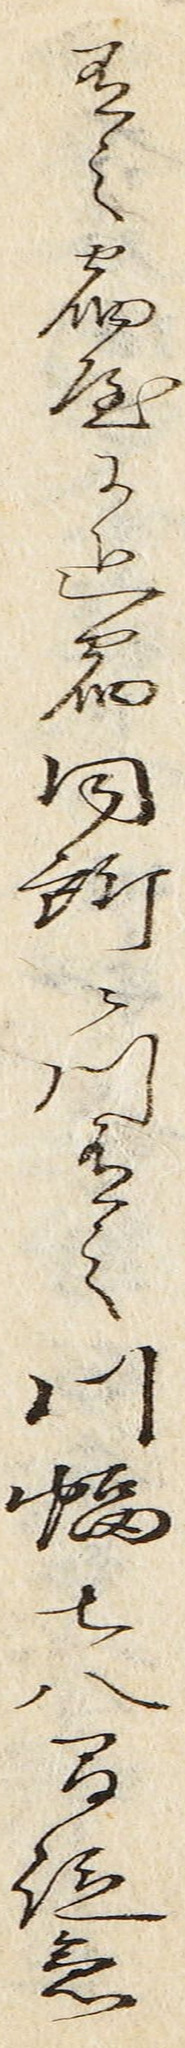有之宿屋に止宿同所に川有之川幅七八間位急
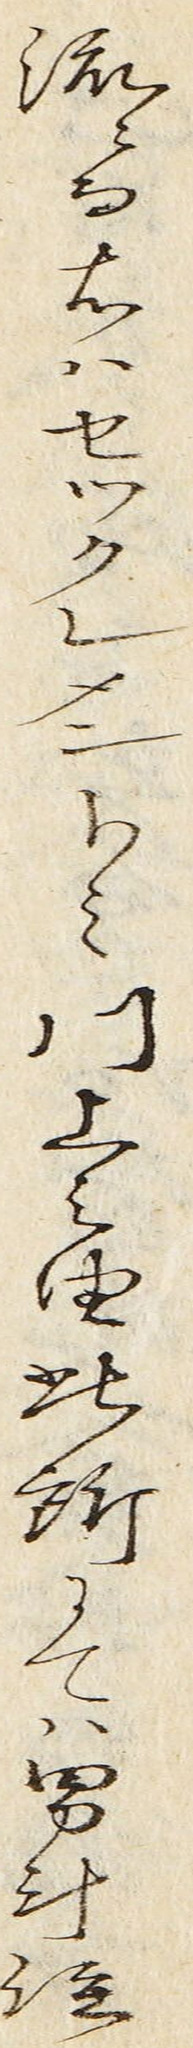流に而右はセツクレメント之川上之由此所にては男計住
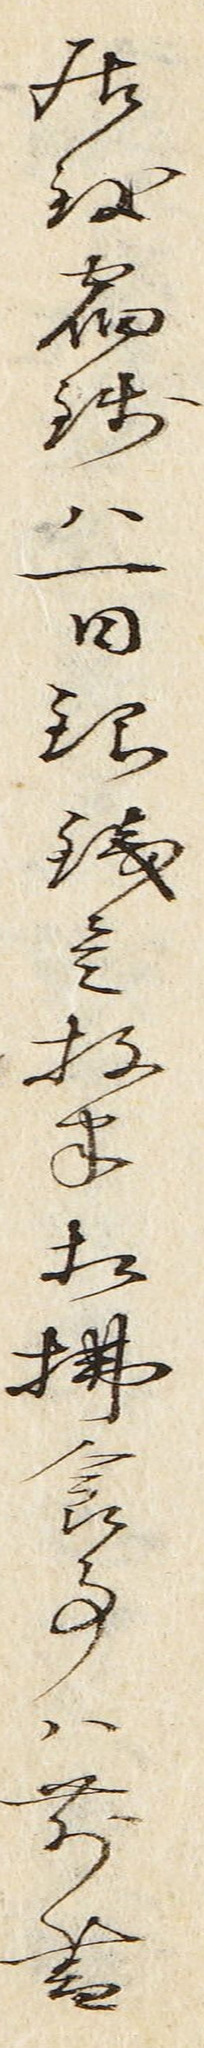居致宿銭は一日銀銭壱枚半相払食事は前暮
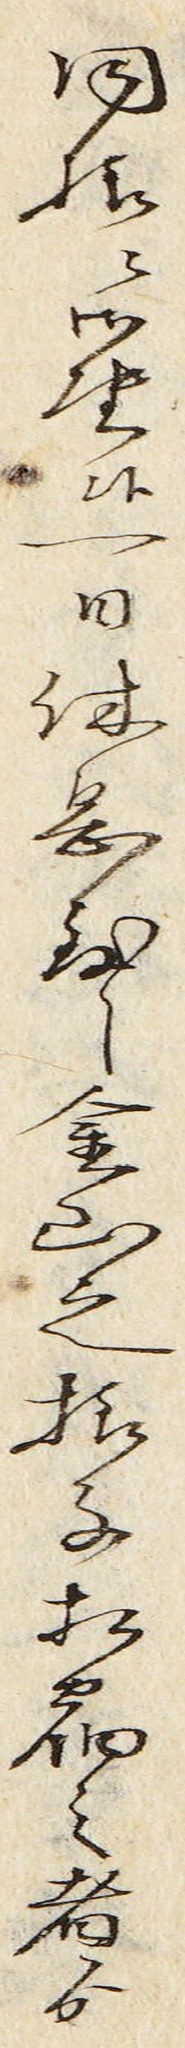同様に御座候一日休息致し金山之様子相宿之者ゟ
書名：土佐中浜万次郎漂流記
